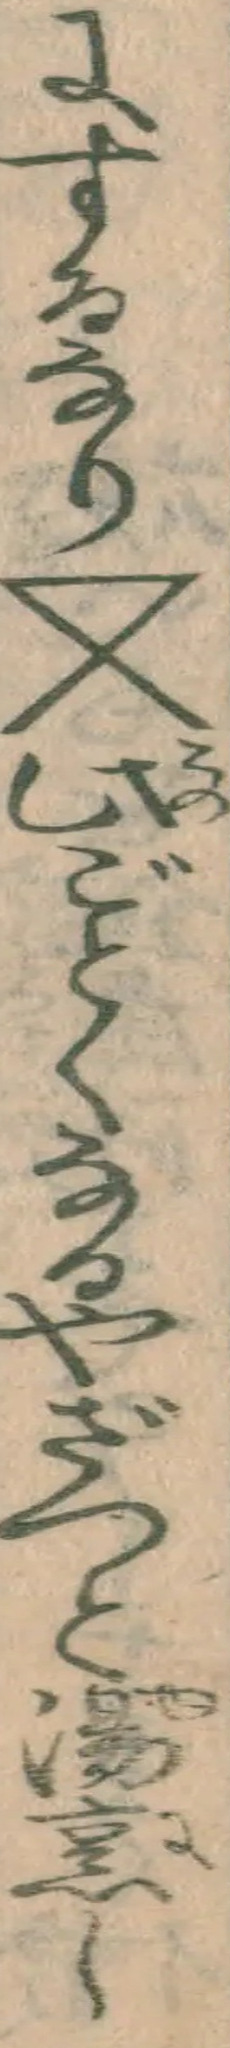にするなり此ごとくなる也ざつと湯烹し
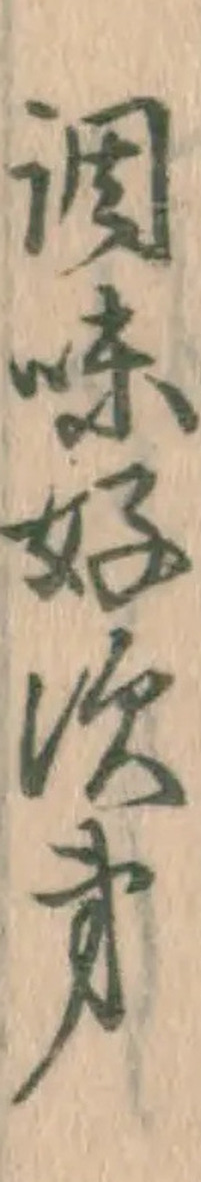調味好次第
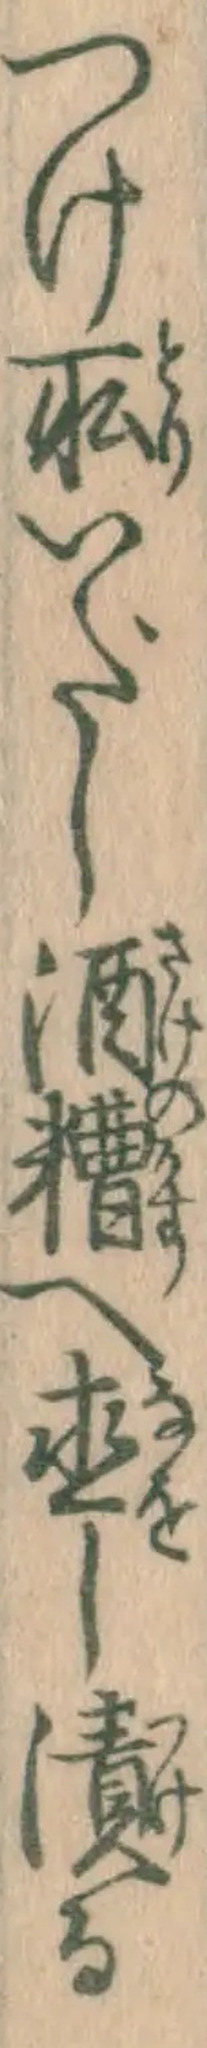つけ取いだし酒糟へ直し漬る
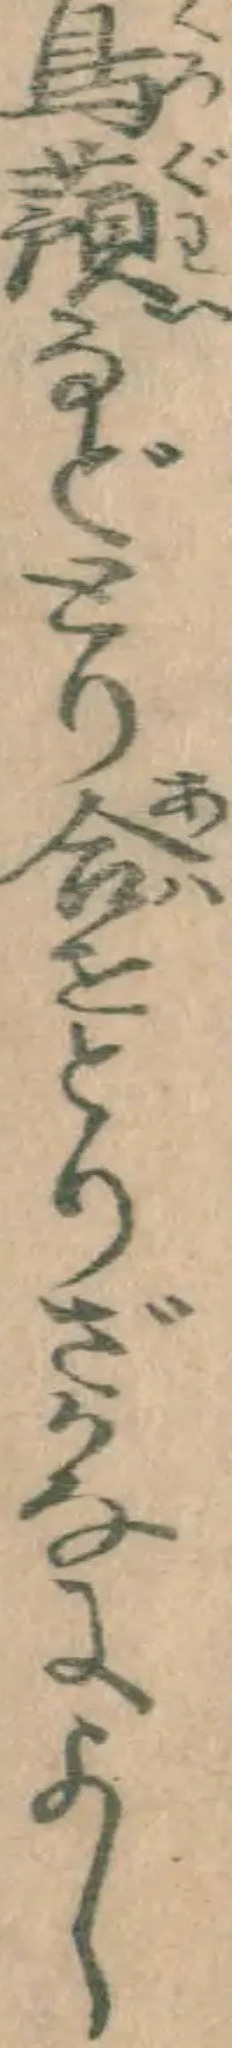鳥蕷などとり合せとりざかなによし

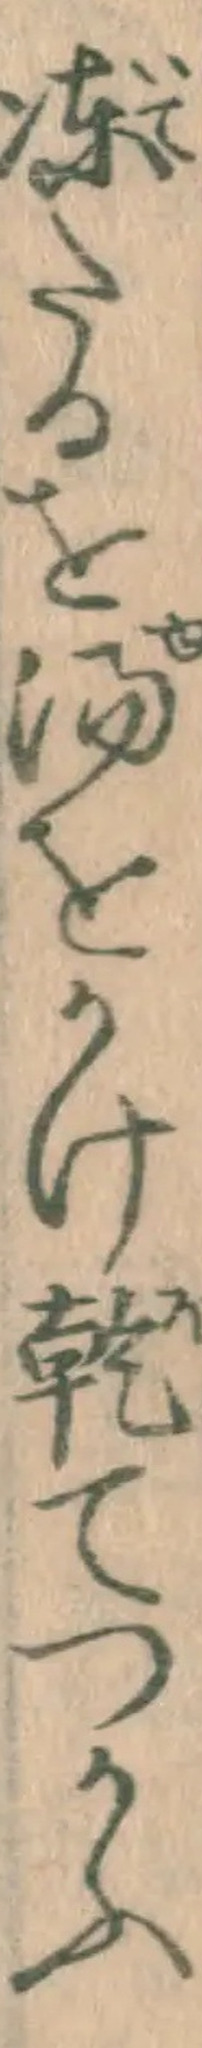凍たるを湯をかけ乾てつかふ
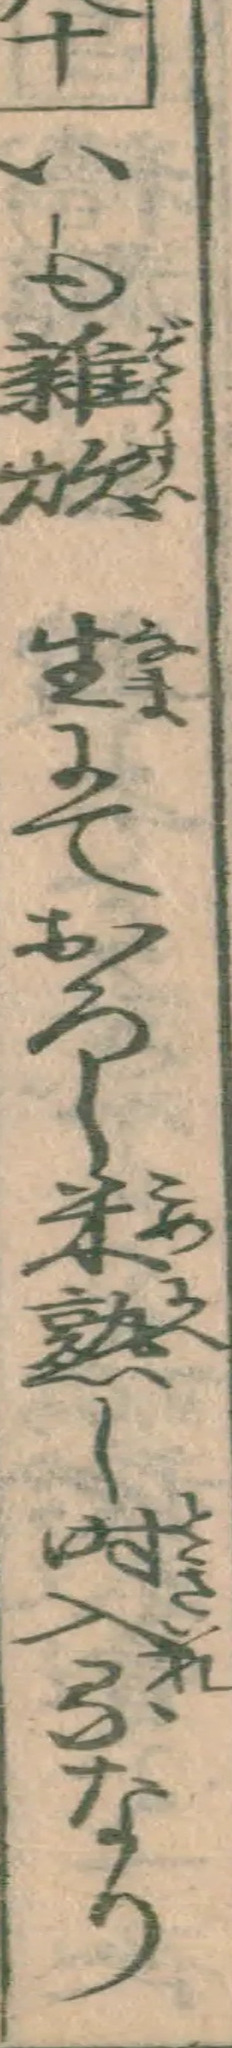[八十]いも雑炊生にておろし米熟し時入るなり
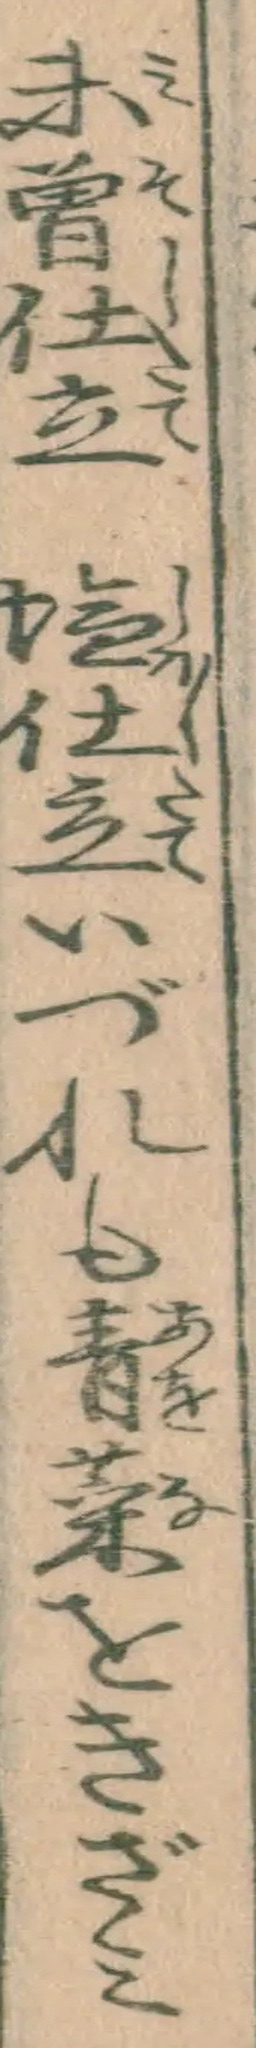未曽仕立塩仕立いづれも青菜をきざみ
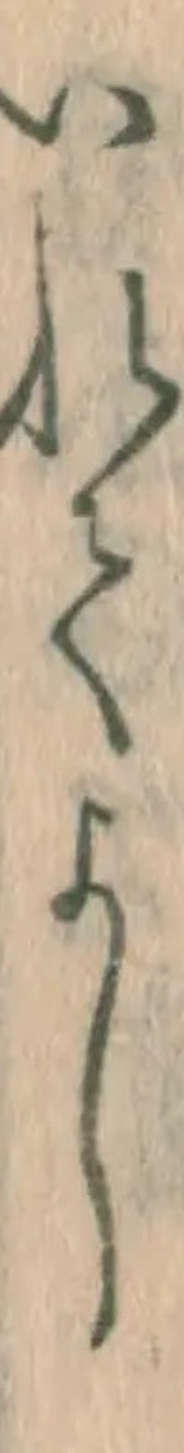いれてよし
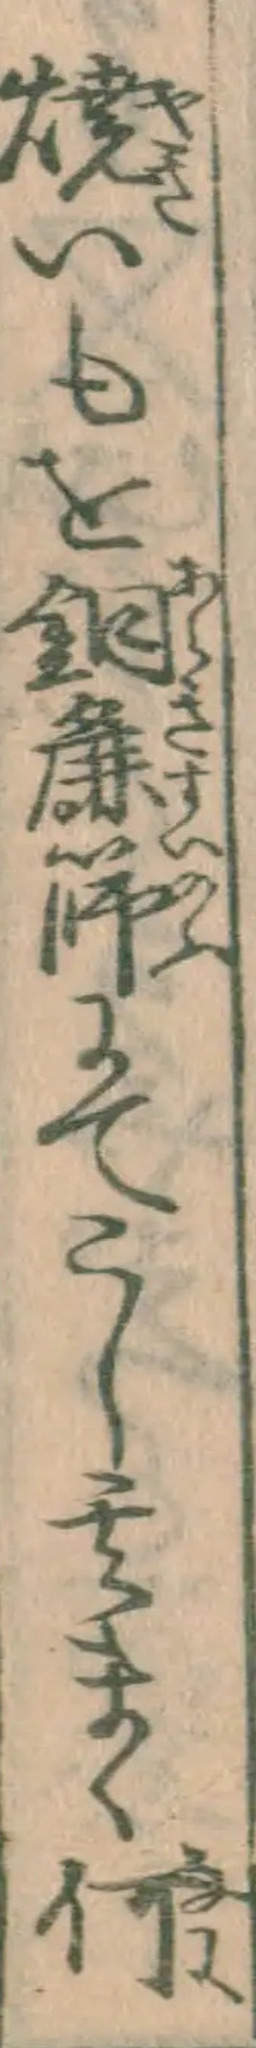焼いもを銅麁篩にてこし其まゝ何
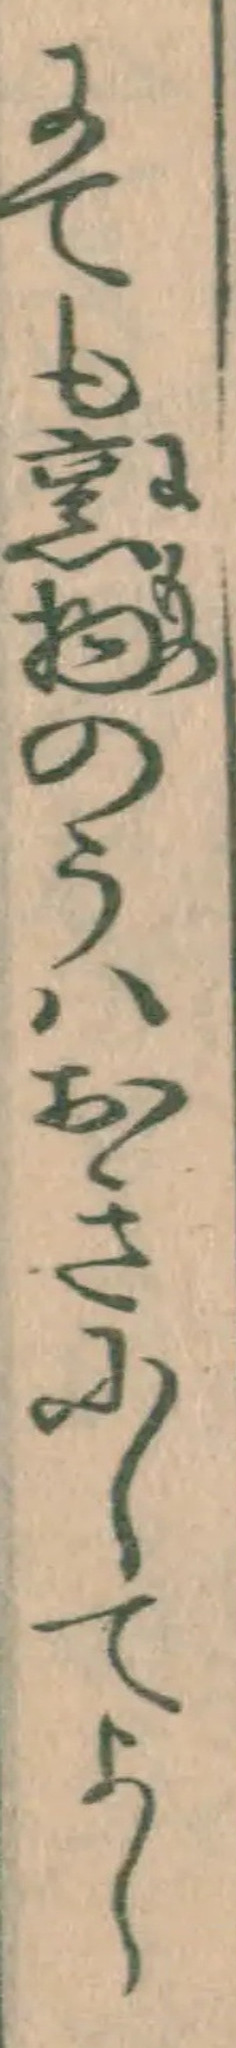にても烹物のうはおきにしてよし
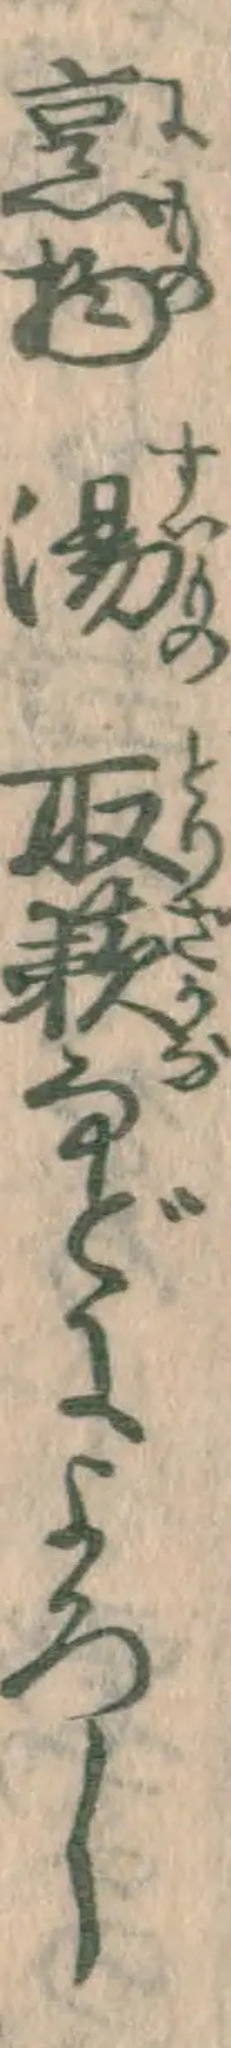烹物湯取簌などによろし
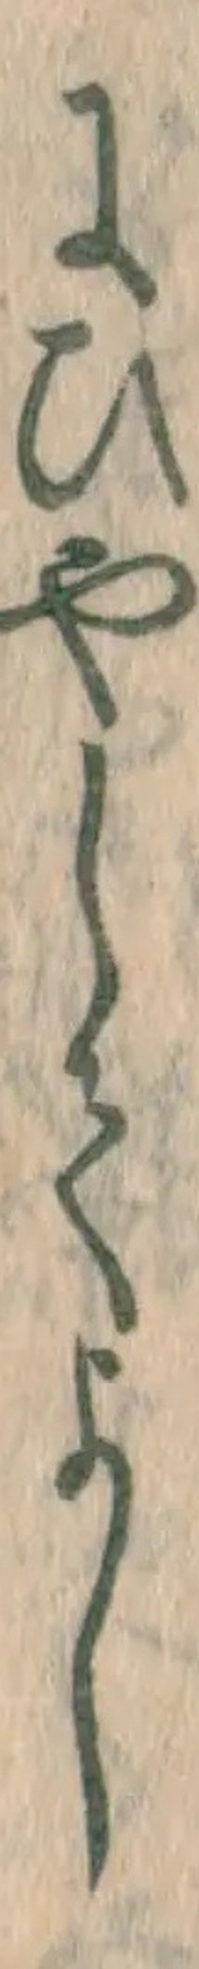にひやしてよし
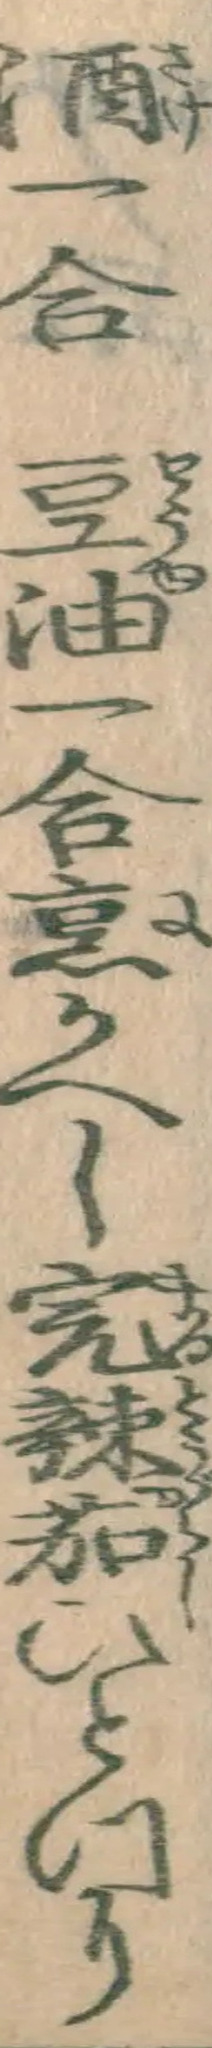酒一合豆油一合烹かへし完辣茄ひとつに
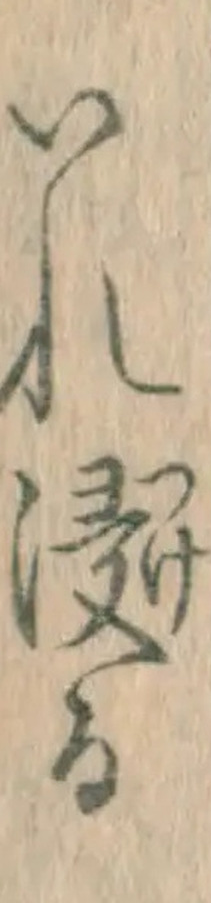いれ浸る

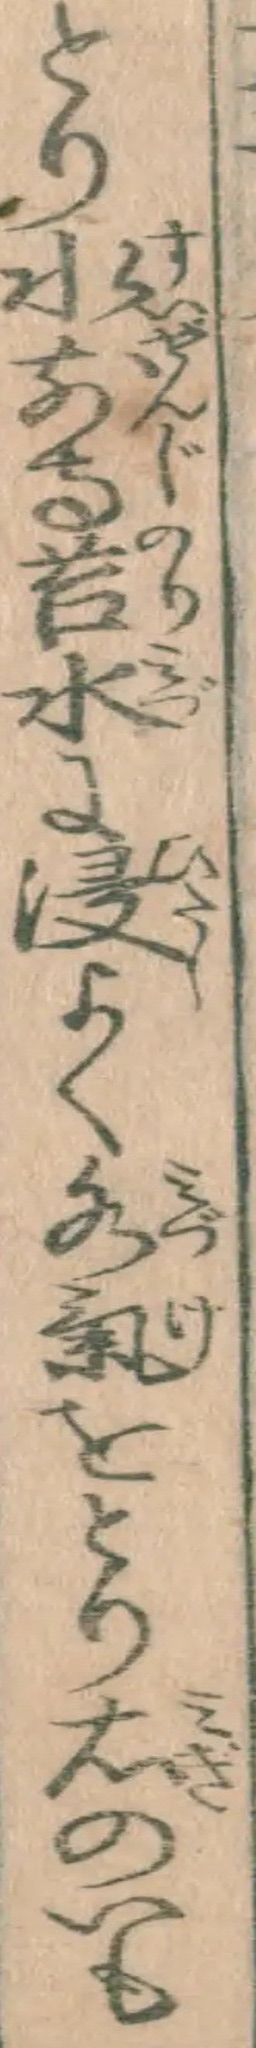とり水前寺苔水に浸よく水気をとり右のいも
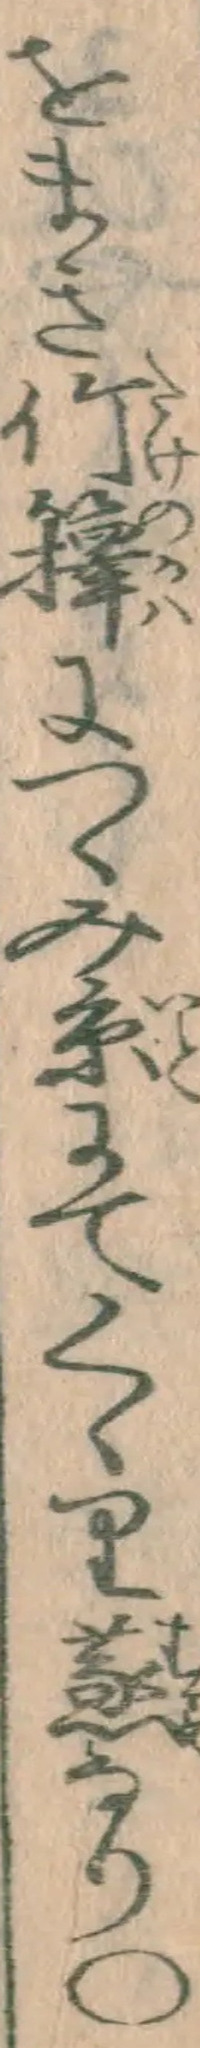をまき竹籜につゝみ糸にてくゝり蒸なり○
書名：甘藷百珍
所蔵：国立国会図書館 National Diet Library, JAPAN
